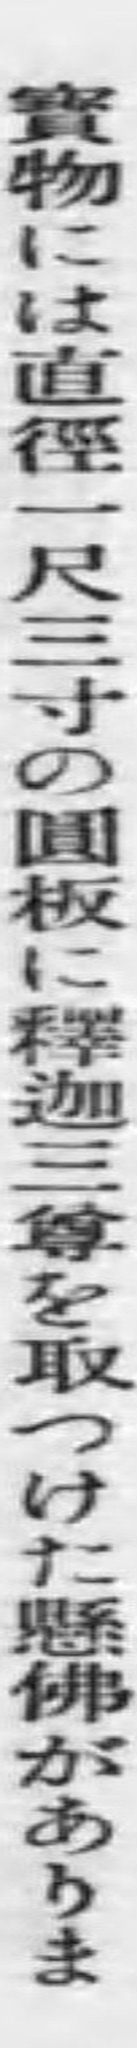宝物には直径一尺三寸の円板に釈迦三尊を取つけた懸仏がありま
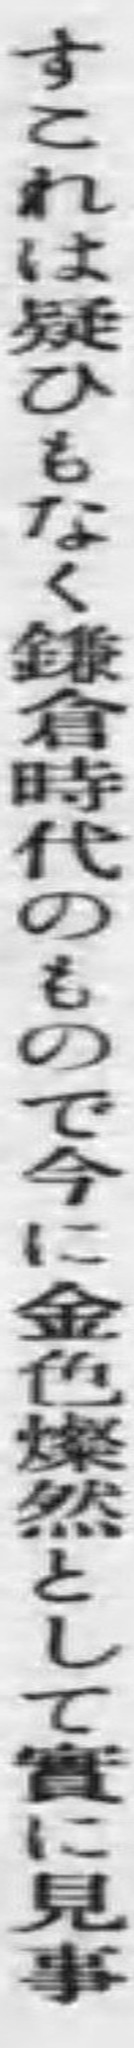すこれは疑ひもなく鎌倉時代のもので今に金色燦然として実に見事
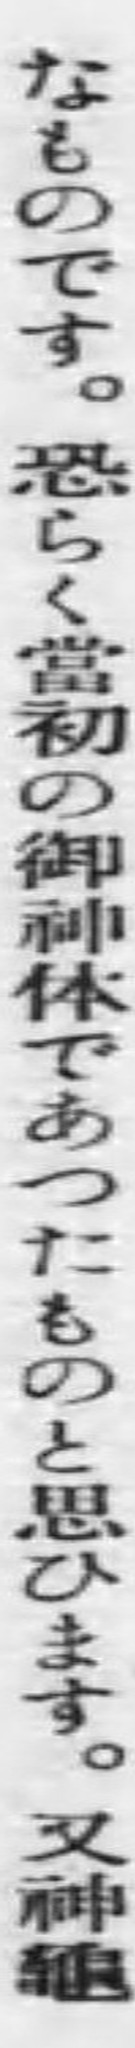なものです。恐らく当初の御神体であつたものと思ひます。又神亀
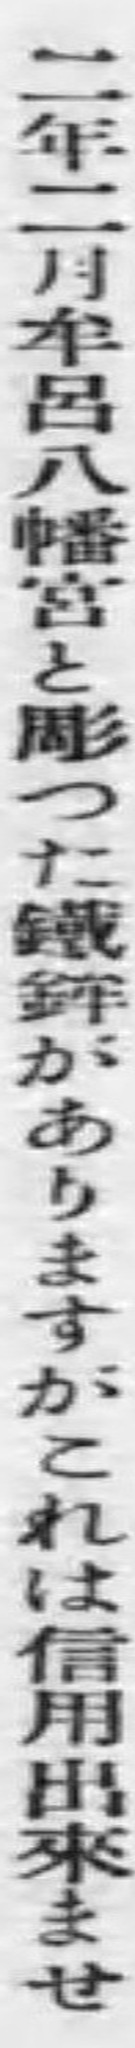二年二月牟呂八幡宮と彫つた鉄鉾がありますがこれは信用出来ませ
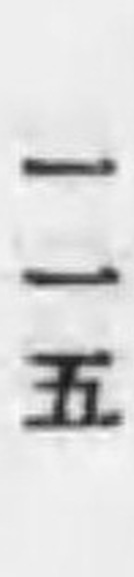一一五

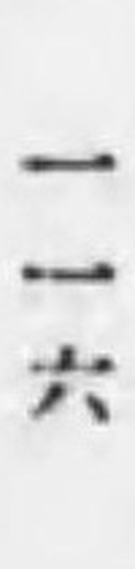一一六
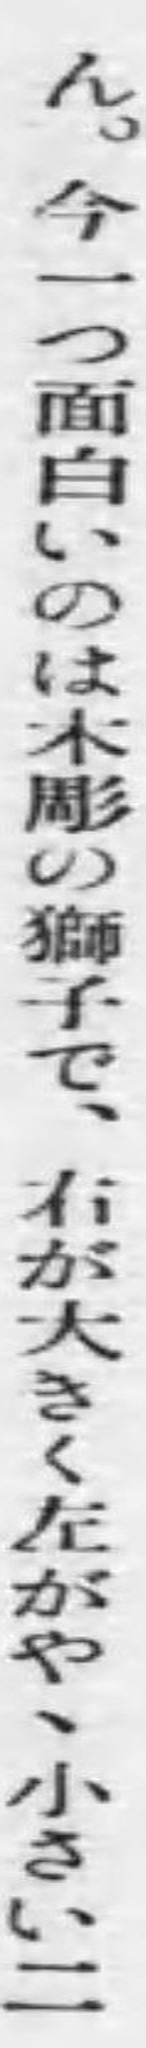ん。今一つ面白いのは木彫の獅子で、右が大きく左がやゝ小さい二
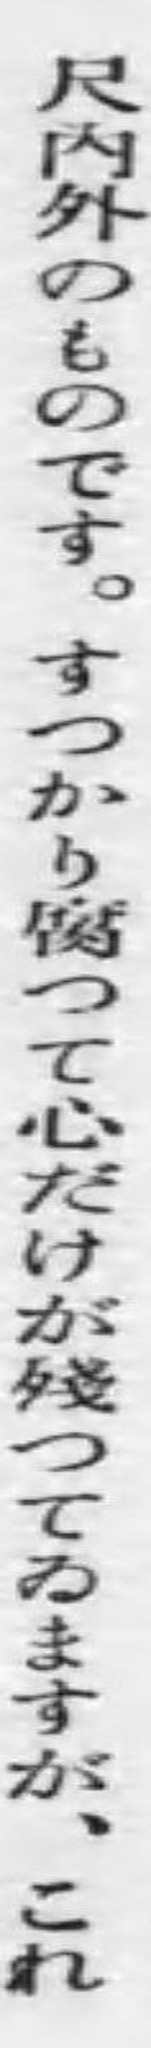尺内外のものです。すつかり腐つて心だけが残つてゐますが、これ
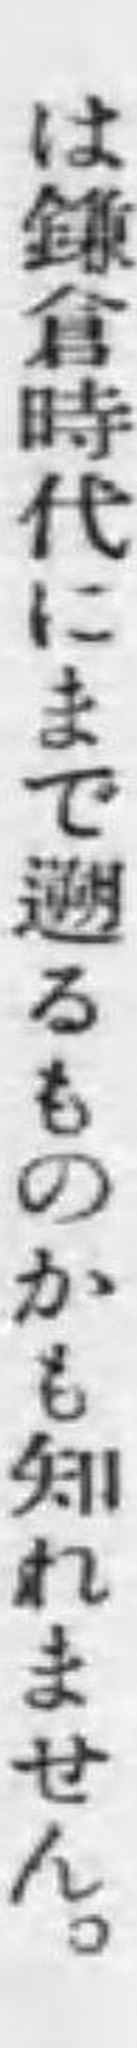は鎌倉時代にまで遡るものかも知れません。
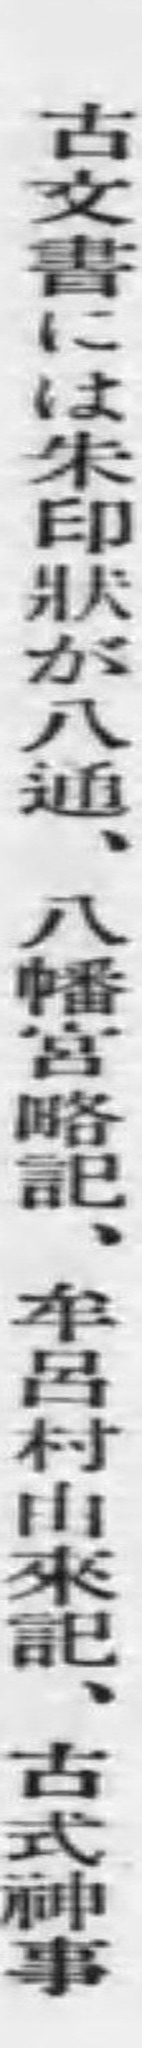古文書には朱印状が八通、八幡宮略記、牟呂村由来記、古式神事
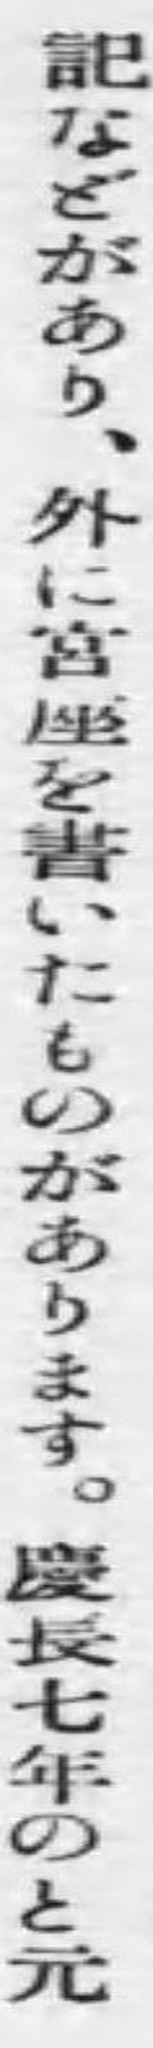記などがあり、外に宮座を書いたものがあります。慶長七年のと元
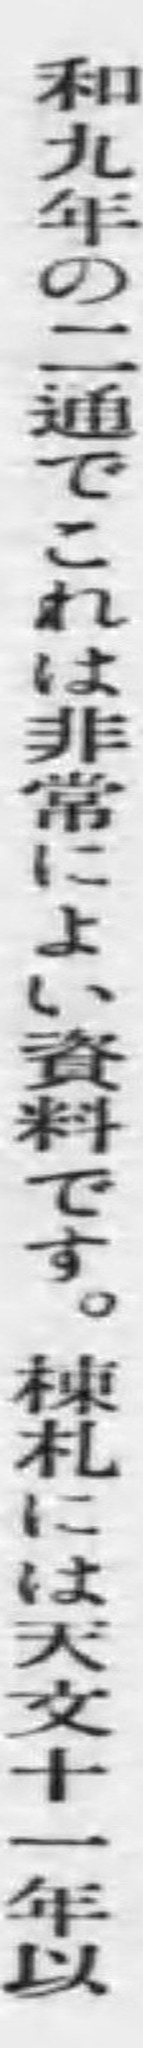和九年の二通でこれは非常によい資料です。棟札には天文十一年以
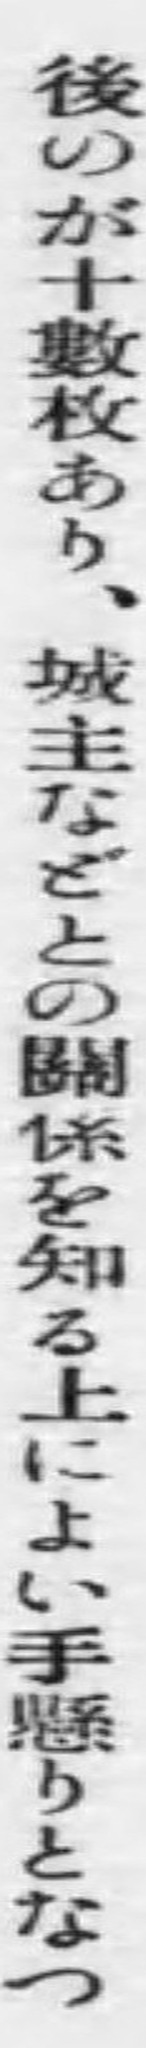後のが十数枚あり、城主などとの関係を知る上によい手懸りとなつ
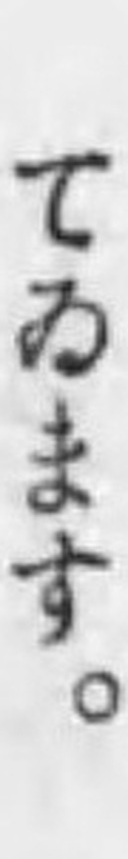てゐます。
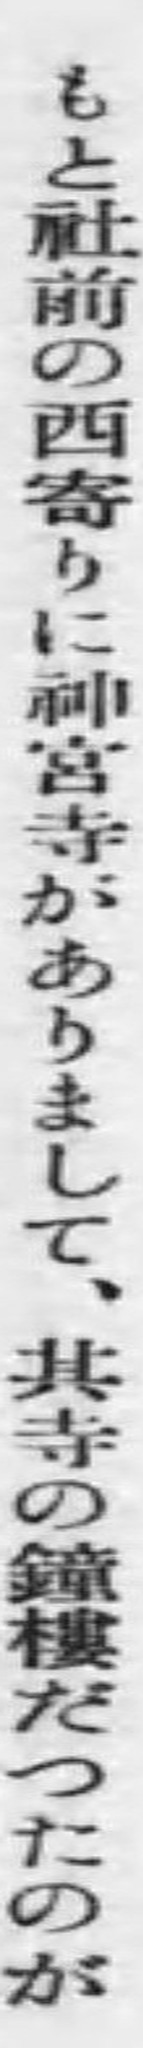もと社前の西寄りに神宮寺がありまして、其寺の鐘楼だつたのが
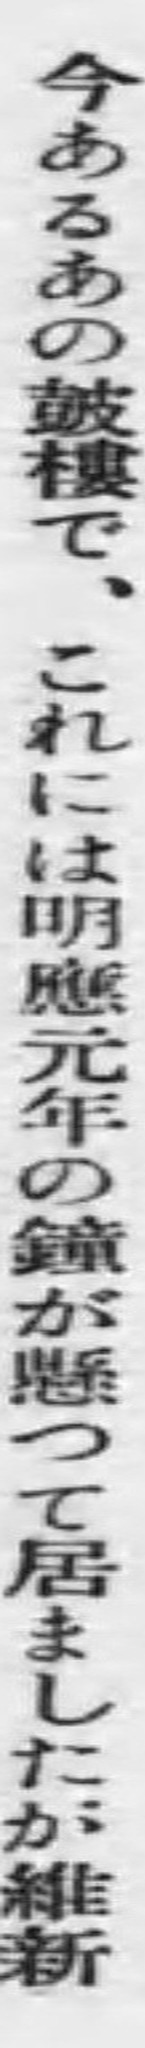今あるあの鼓楼で、これには明応元年の鐘が懸つて居ましたが維新
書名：東三河道中記 : 豊橋市及其附近案内
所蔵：国立国会図書館 National Diet Library, JAPAN
